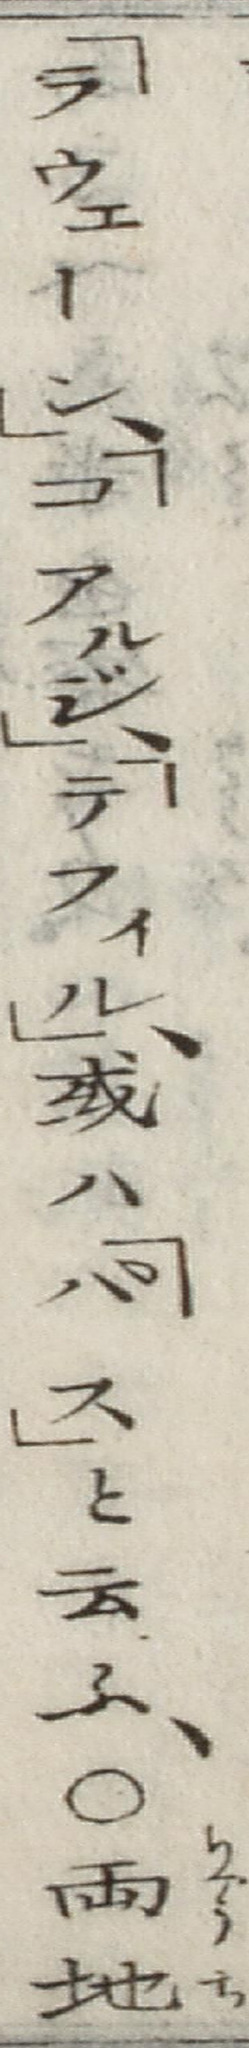「ラウェーン」、「コアルジ」、「テフィル」、或は「パス」と云ふ、○両地
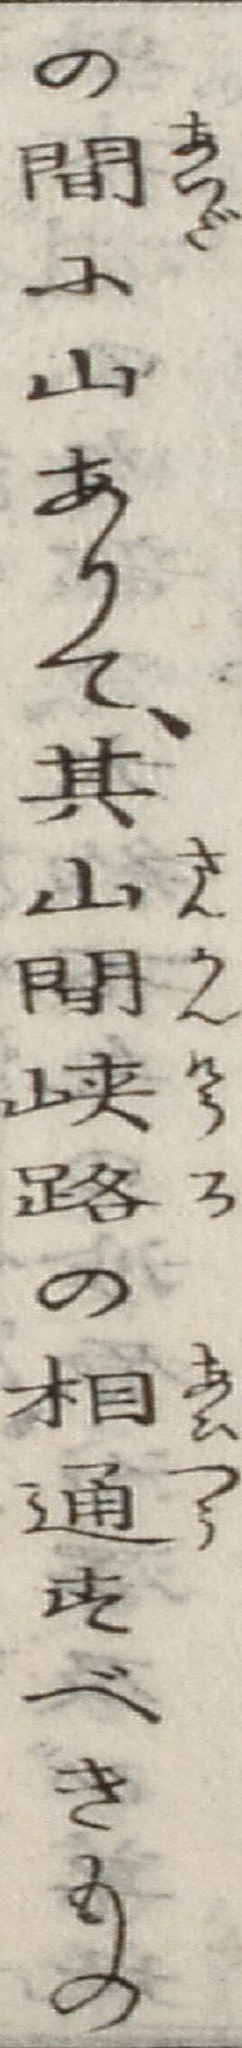の間に山ありて、其山間峡路の相通すべきもの
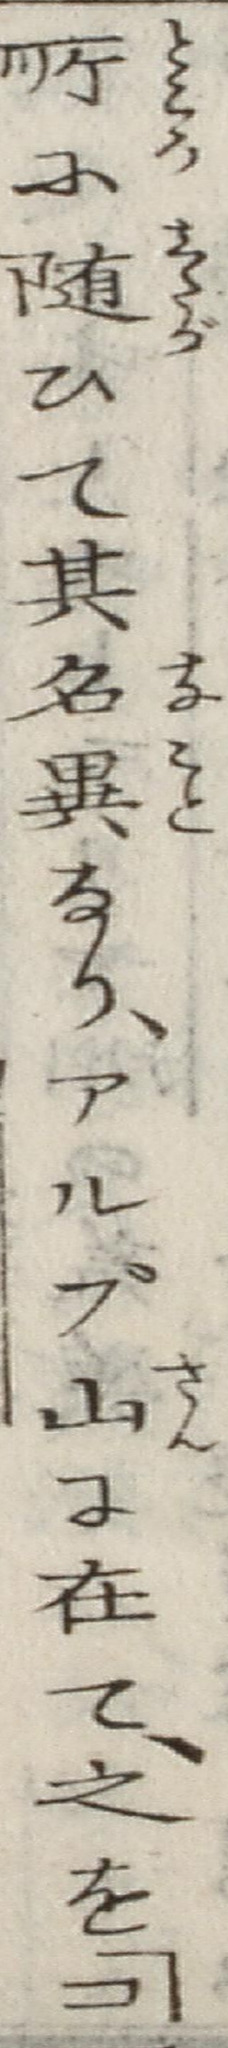所に随ひて其名異なり、アルプ山に在て、之を「コ
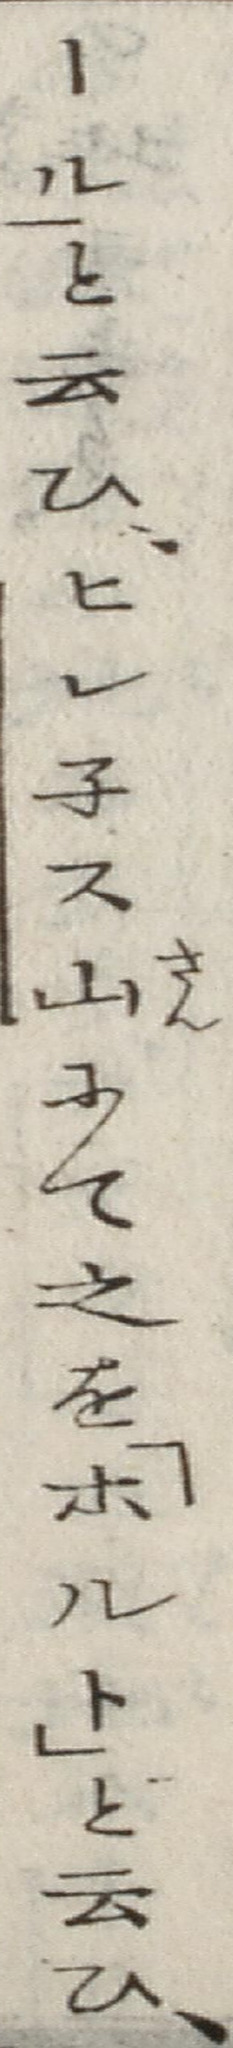ール」と云ひ、ヒレ子ス山にて之を「ホルト」と云ひ、
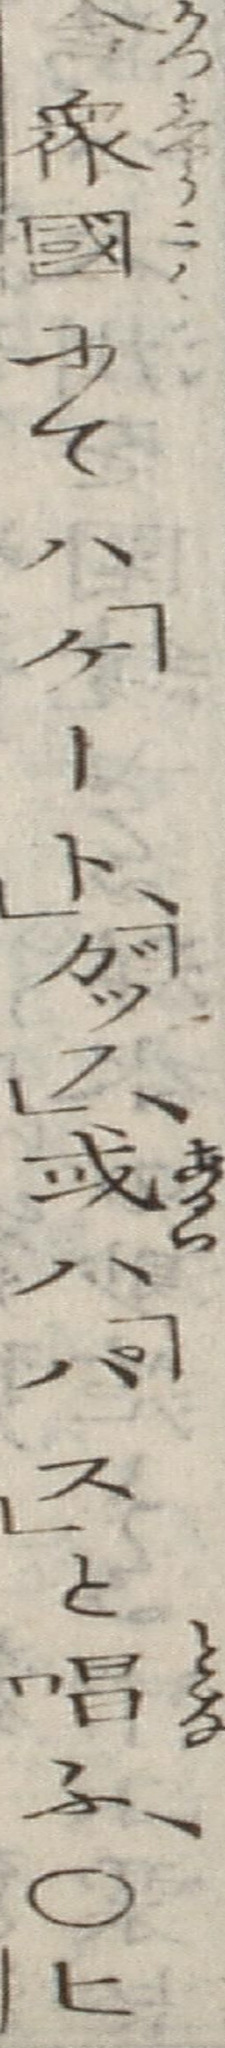合衆国にては「ケート」、「ガッフ」、或は「パス」と唱ふ、○ヒ
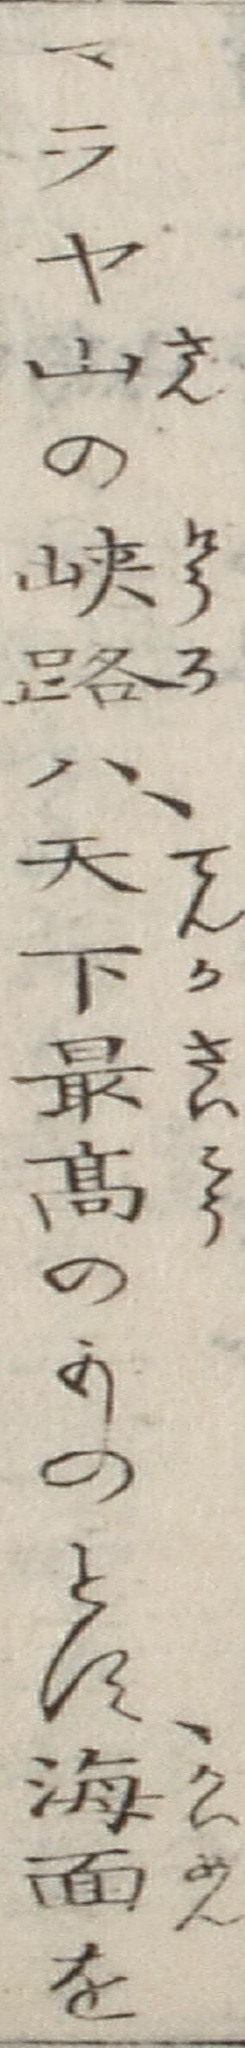マラヤ山の峡路は、天下最高のものとす、海面を
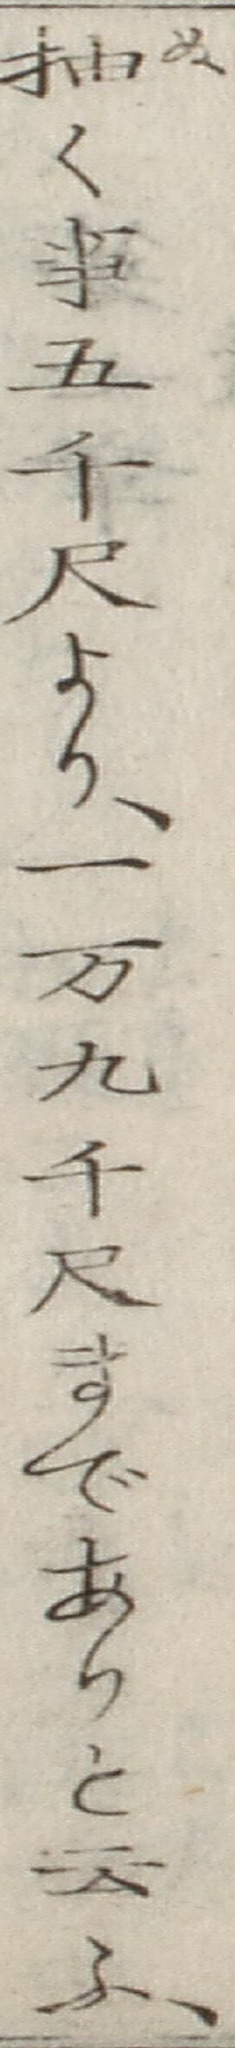抜く事五千尺より、一万九千尺までありと云ふ、
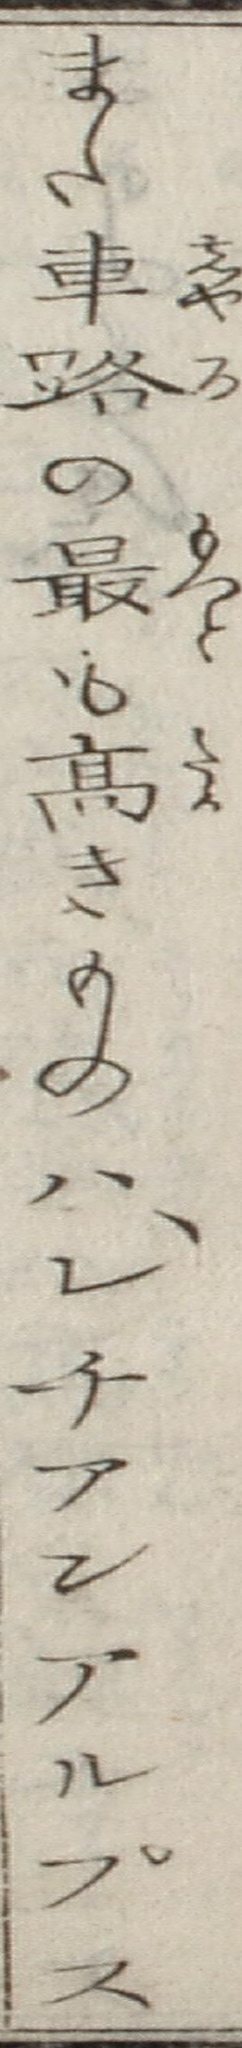また車路の最も高きものは、レチアンアルプス
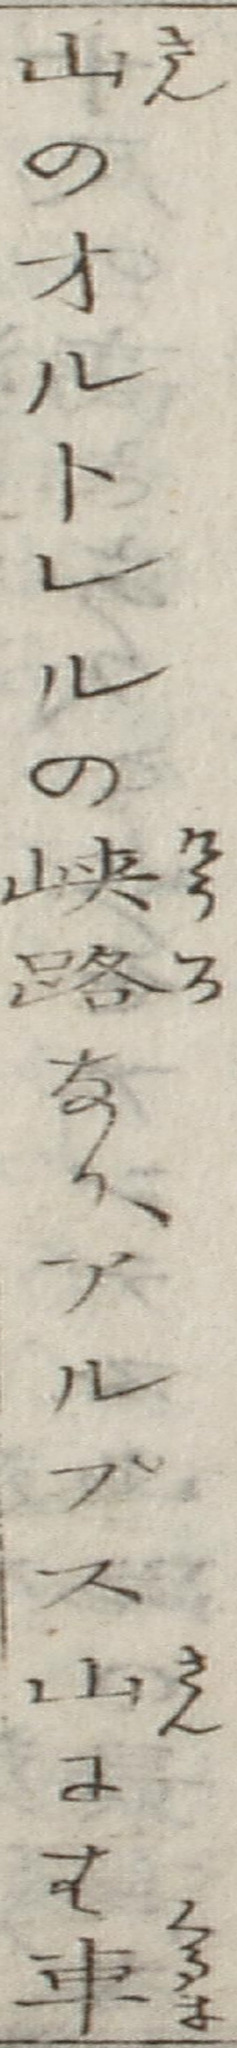山のオルトレルの峡路なり、アルプス山には車
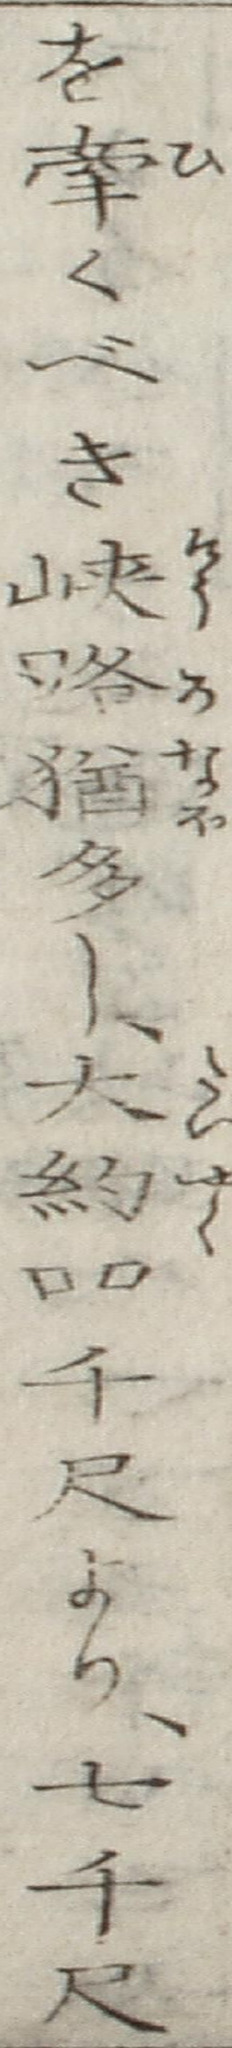を牽くべき峡路猶多し、大約四千尺より、七千尺
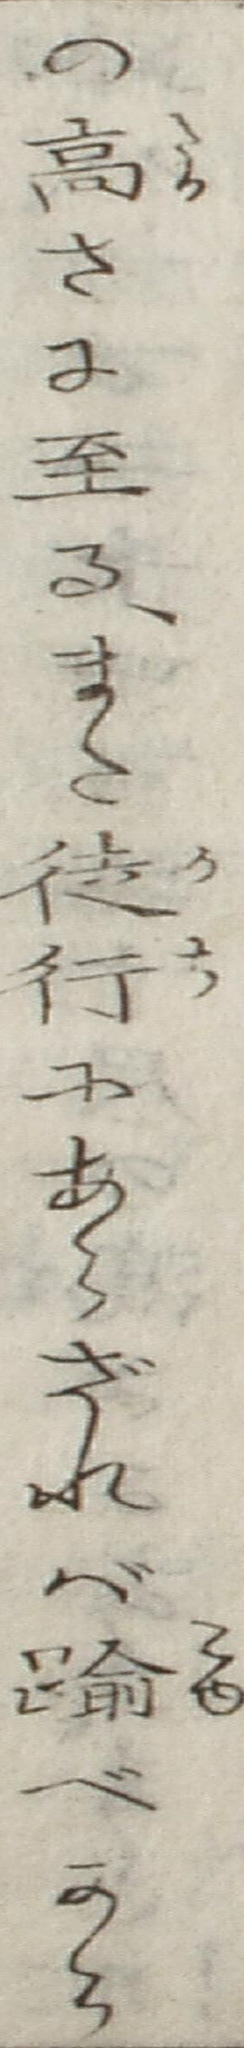の高さに至る、また徒行にあらざれば踰べから
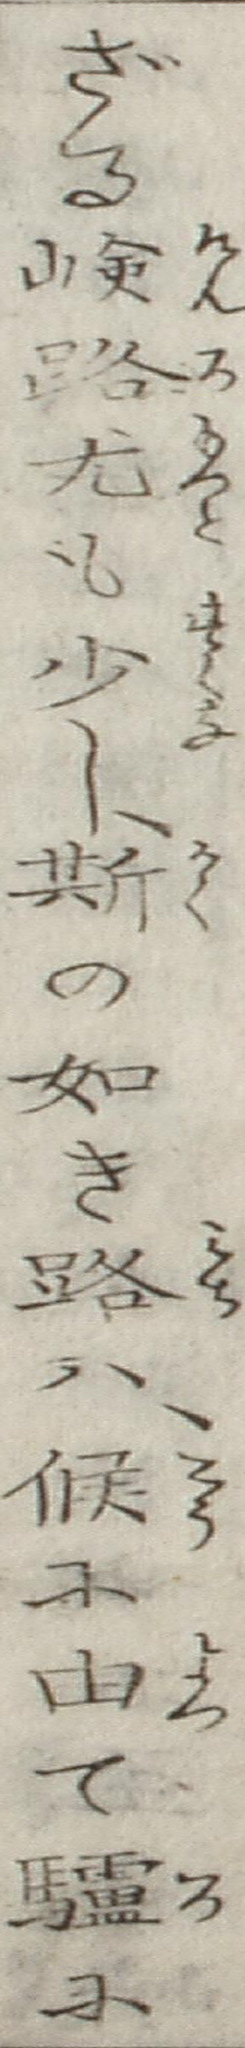ざる嶮路尤も少し、斯の如き路は、候に由て驢に
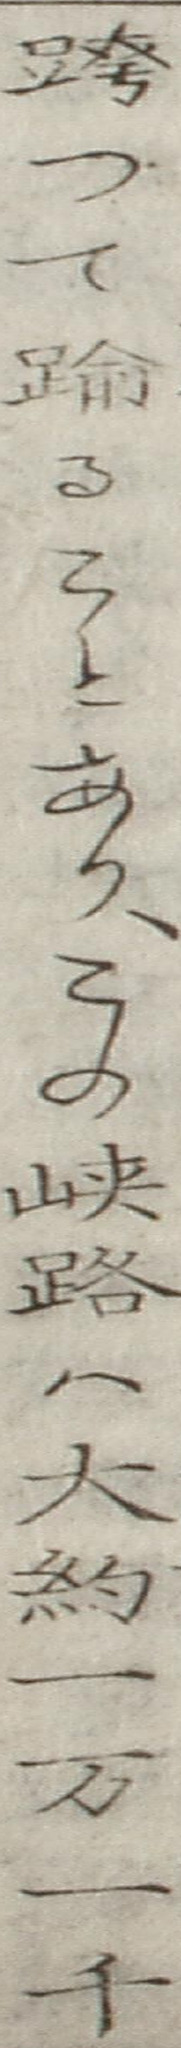跨って踰ることあり、この峡路は大約一万一千

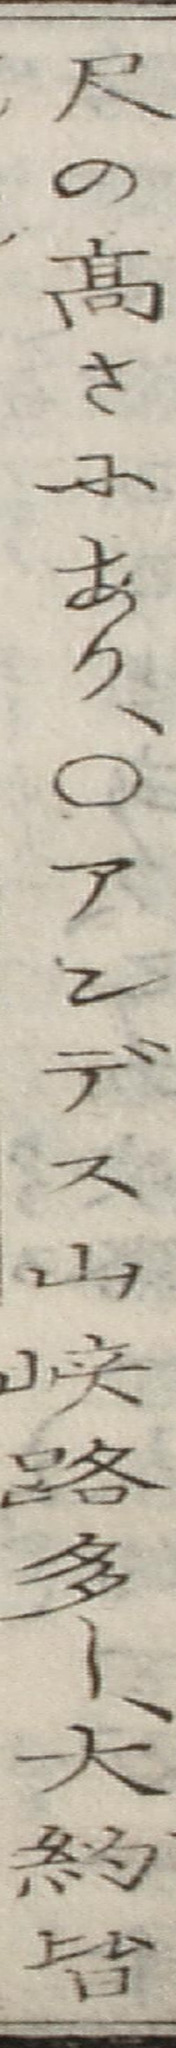尺の高さにあり、○アンデス山峡路多し、大約皆
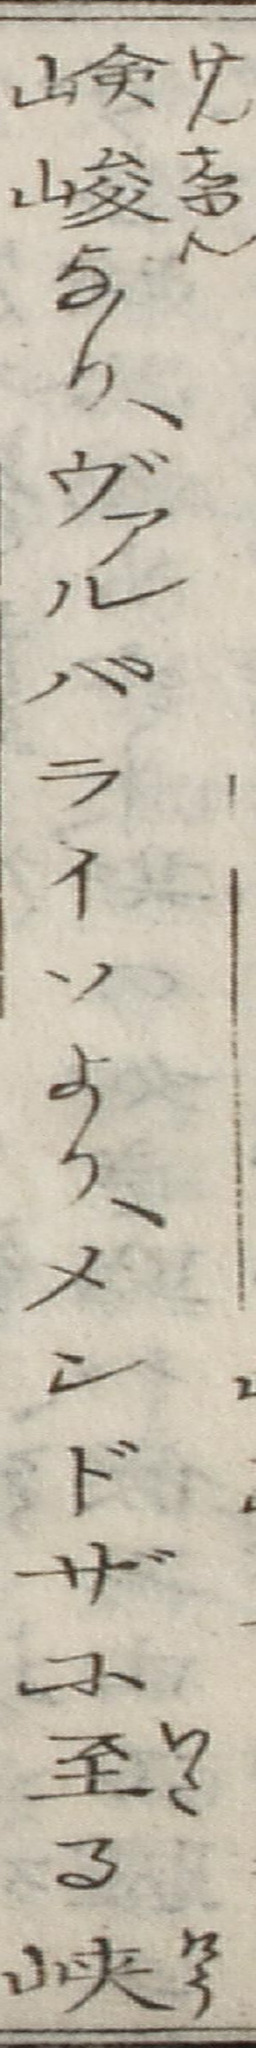嶮峻なり、ヴァルパライソより、メンドザに至る峡
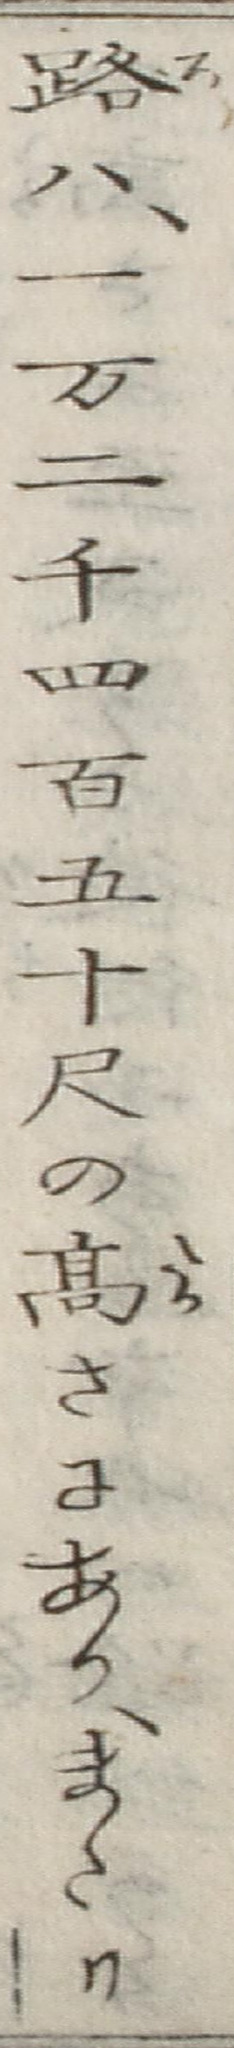路は、一万二千四百五十尺の高さにあり、またリ
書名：訓蒙　天然地理學　上
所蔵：東京大学地震研究所図書室 Earthquake Research Institute Library, The University of Tokyo, JAPAN
